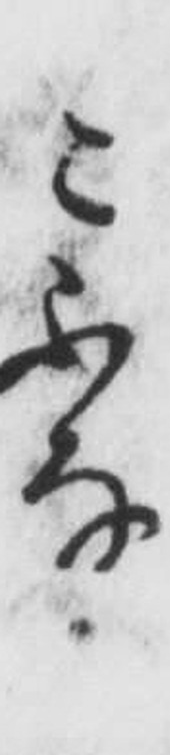こふな
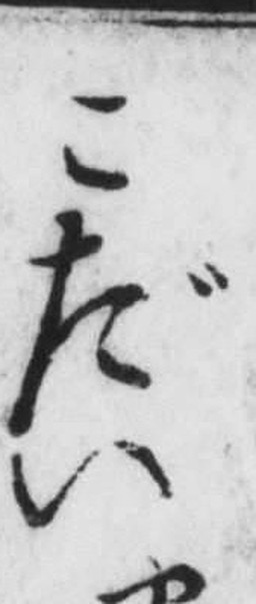こだい
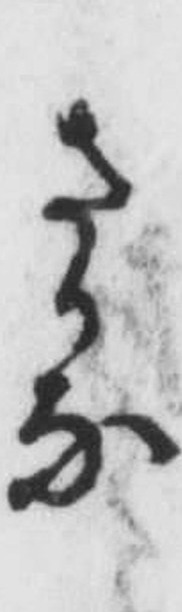さかな
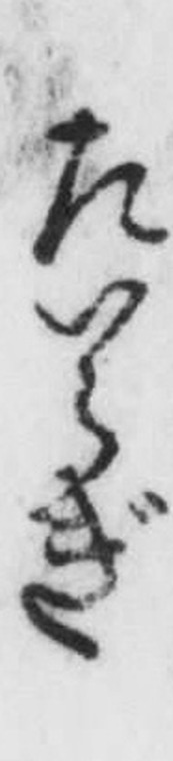たいらぎ
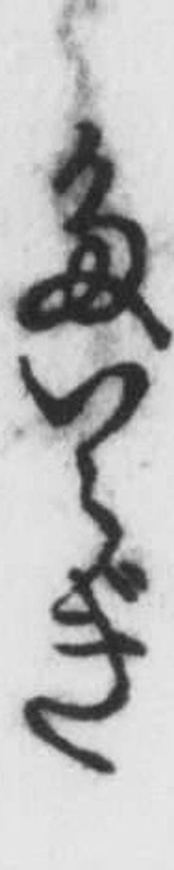たいらぎ
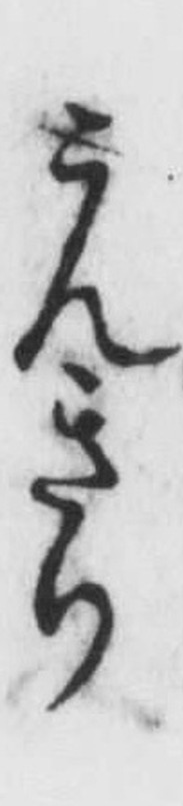とんきり
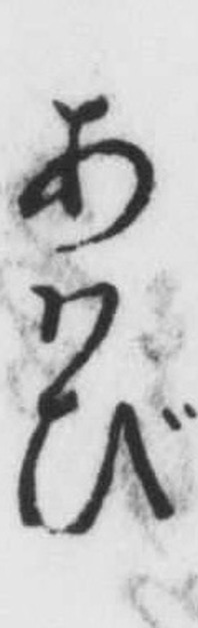あワび
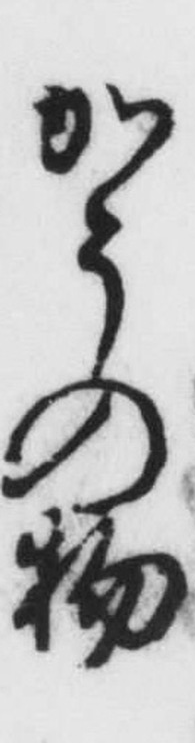かうの物
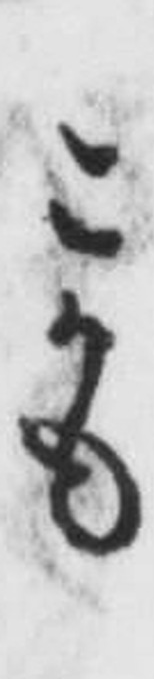こかも
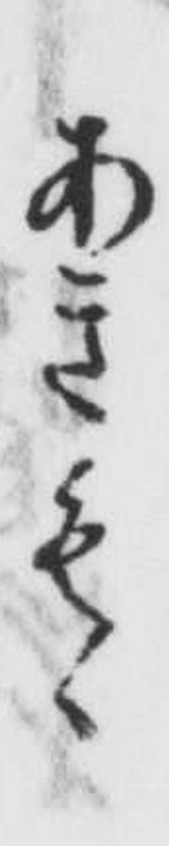あきもゝ
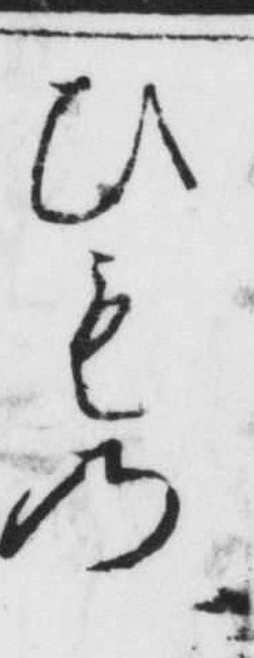ひもの
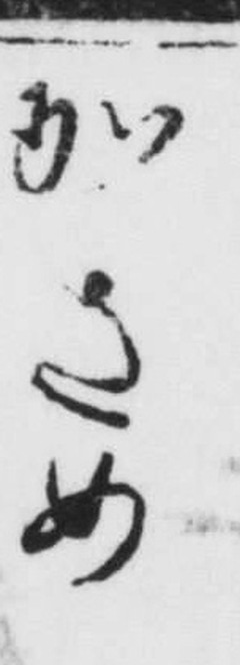かため
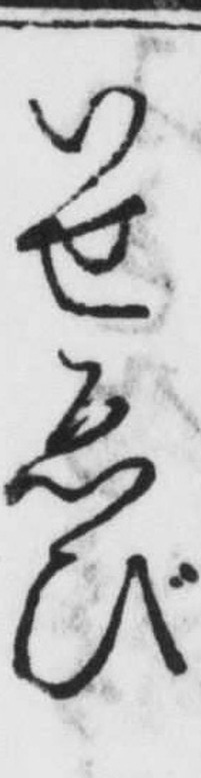いせゑび
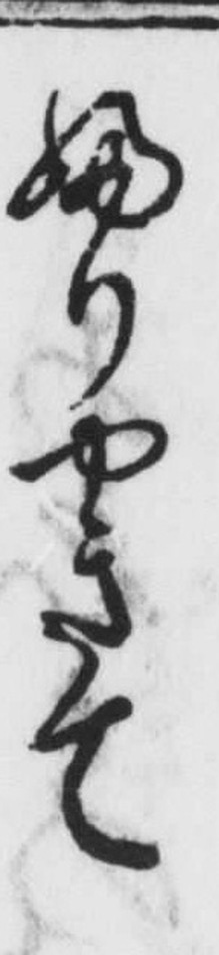ふりやきて
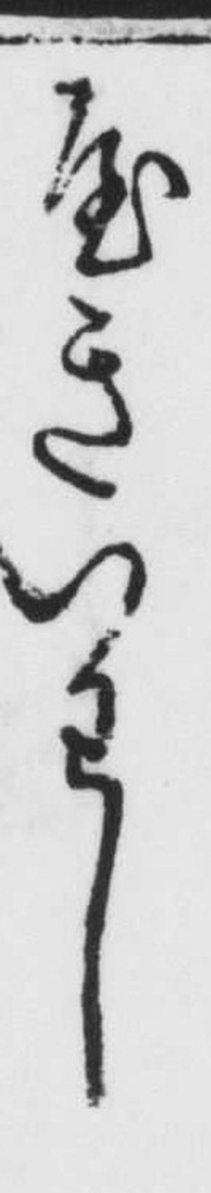へきいわし
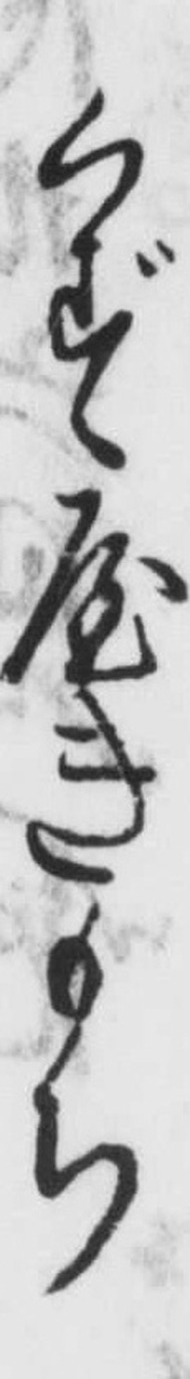くずへきもち
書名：料理切形秘伝抄
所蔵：大阪府立大学学術情報センター 国文学研究資料館
